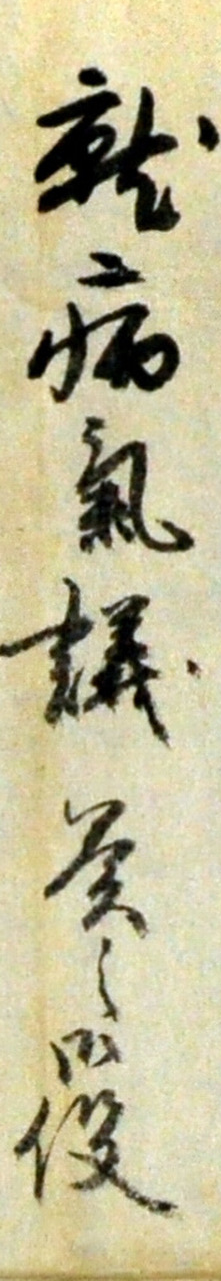就病気議奏之御役
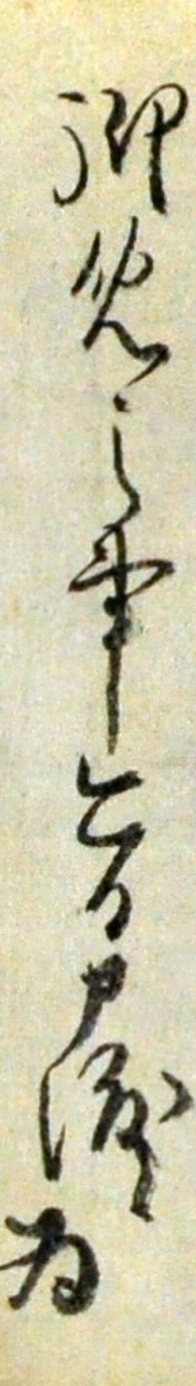御免之事今日申渡候為
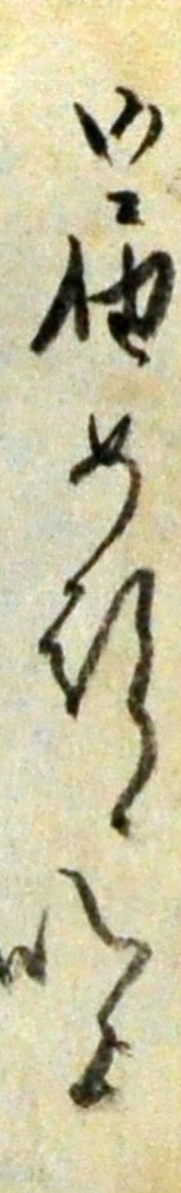御届如斯候以上
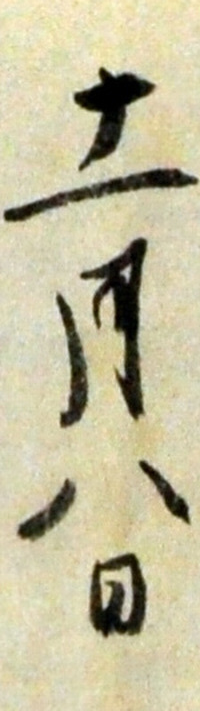十一月八日
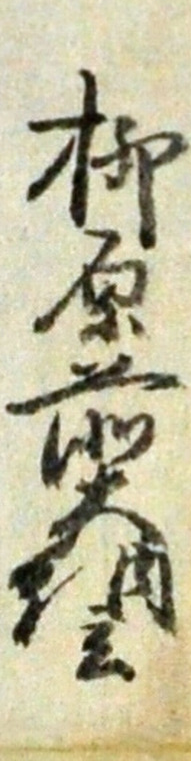柳原前大納言
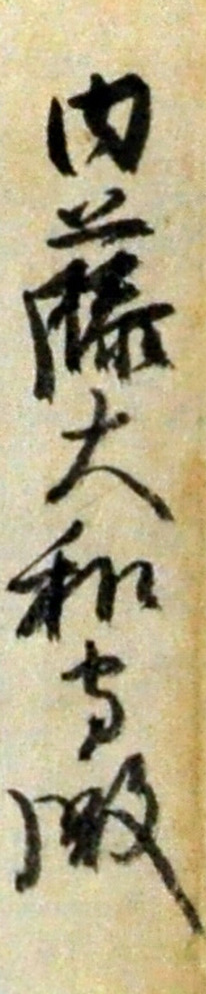内藤大和守殿
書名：書状
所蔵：伊那市立高遠町図書館・合同会社AMANE
